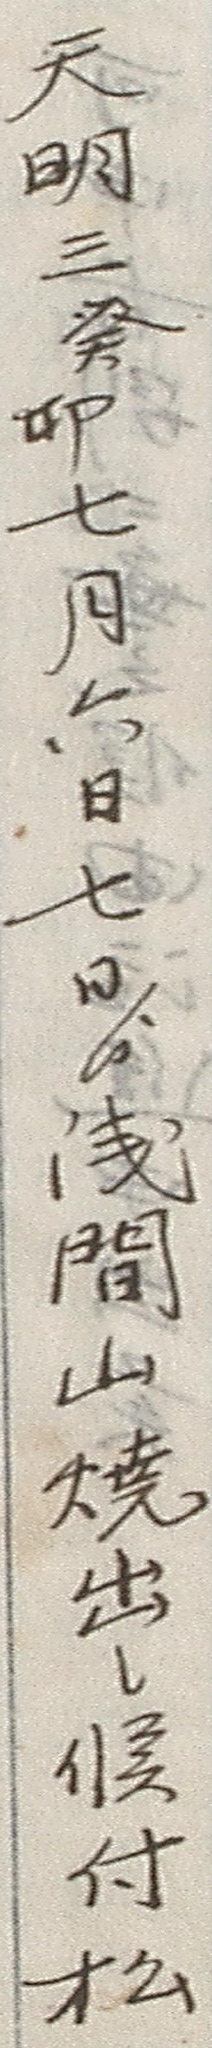天明三癸卯七月六日七日ゟ浅間山焼出し候付松
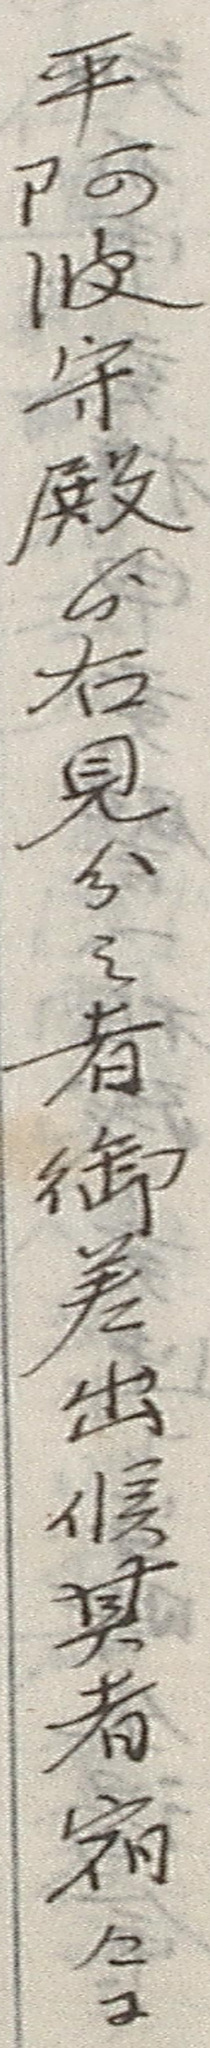平阿波守殿ゟ右見分之者御差出候其者宿々に
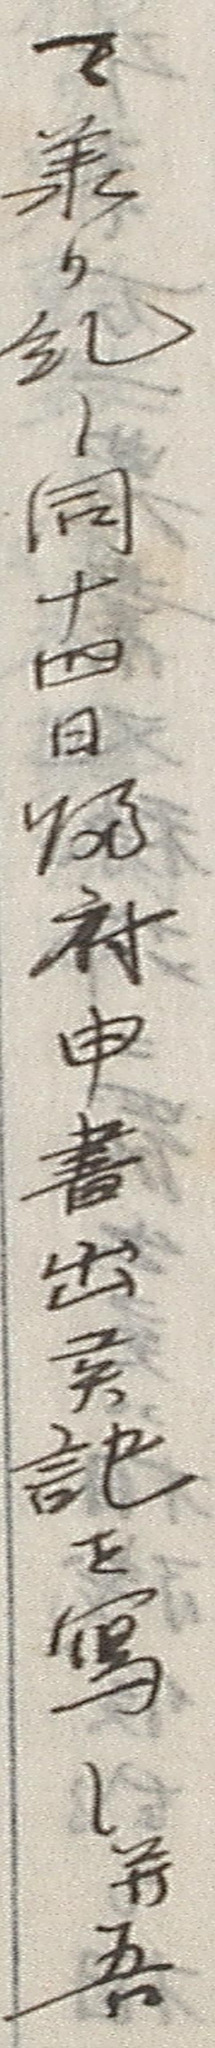て承り糺し同十四日帰村申書出候記を写し并吾
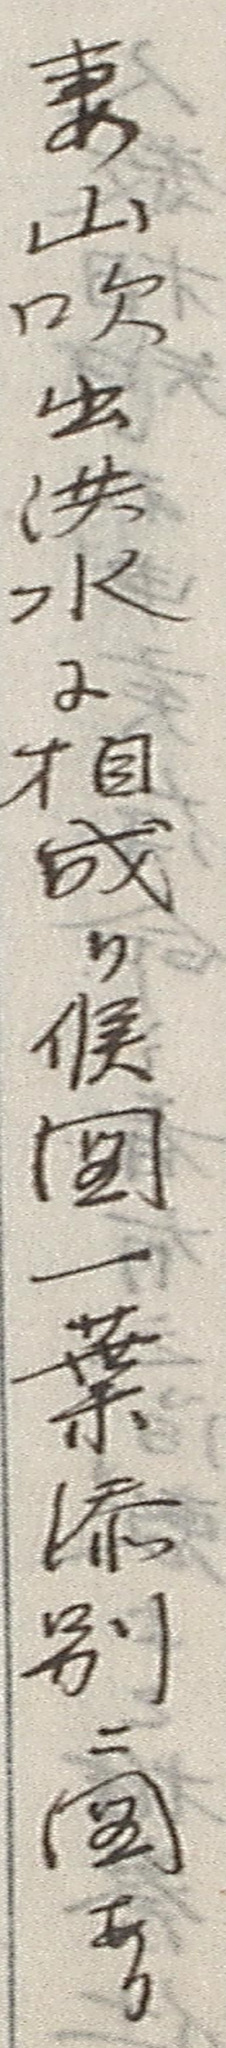妻山吹出洪水に相成候図一葉添別二圖あり
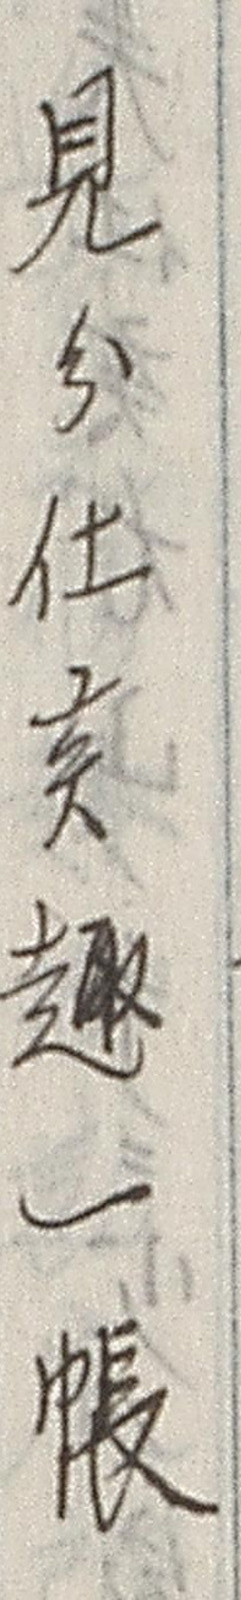見分仕候趣一帳
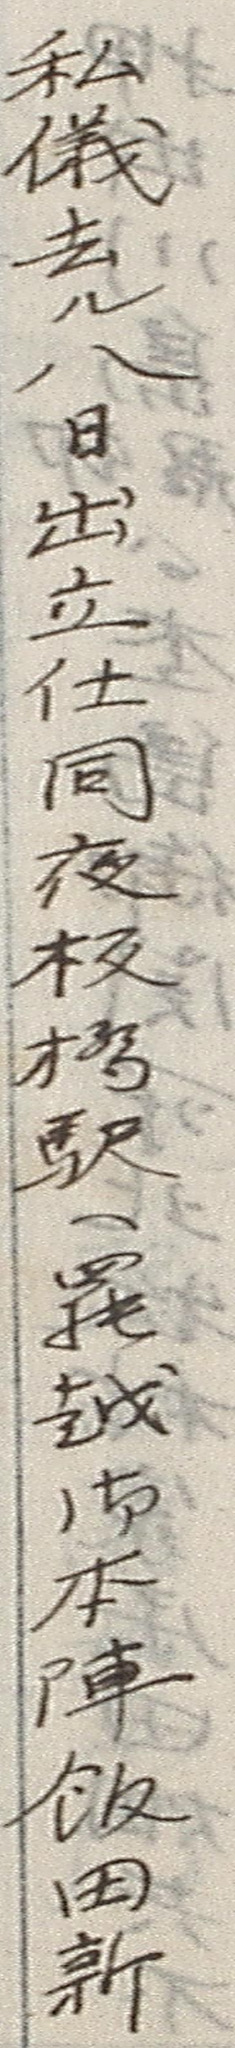私儀去ㇽ八日出立仕同夜板橋宿へ罷越御本陣飯田新
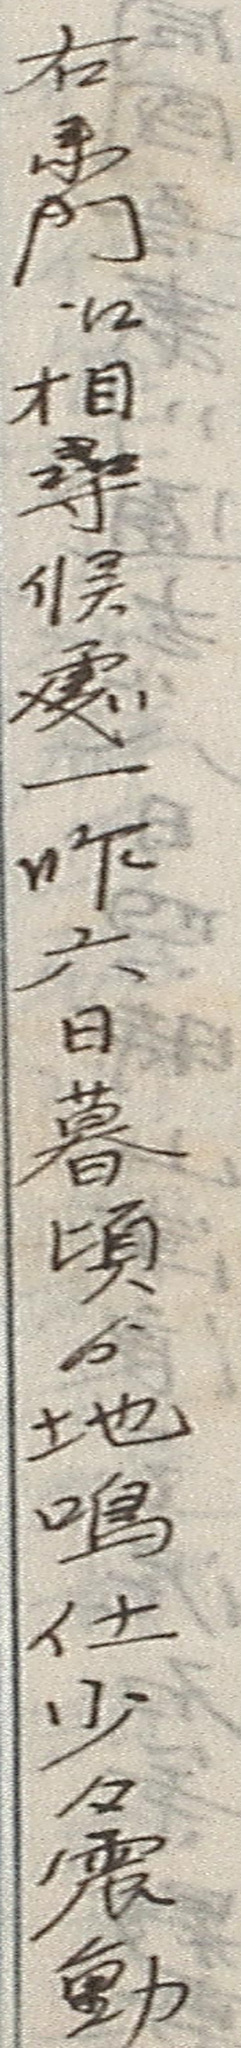右衛門江相尋候処一昨六日暮頃ゟ地鳴仕少々震動
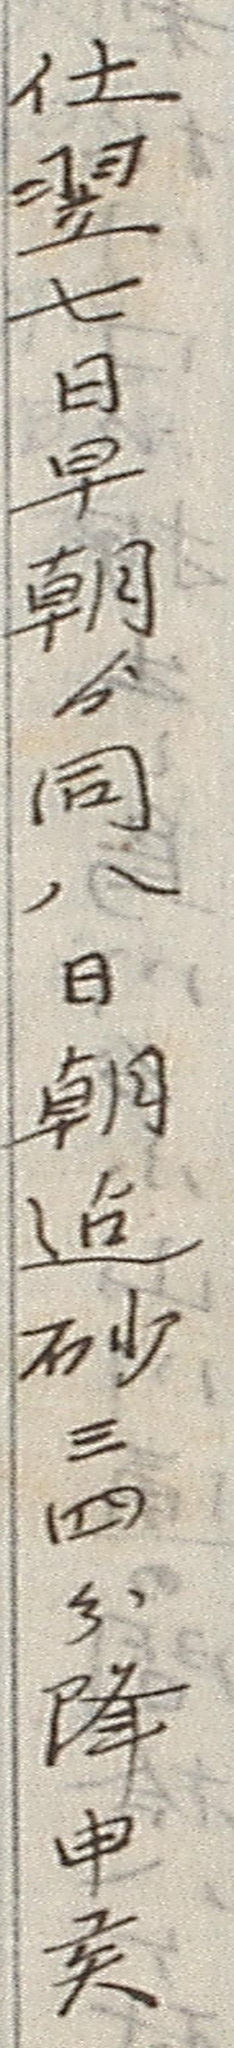仕翌七日早朝ゟ同八日朝迄砂三四分降申候
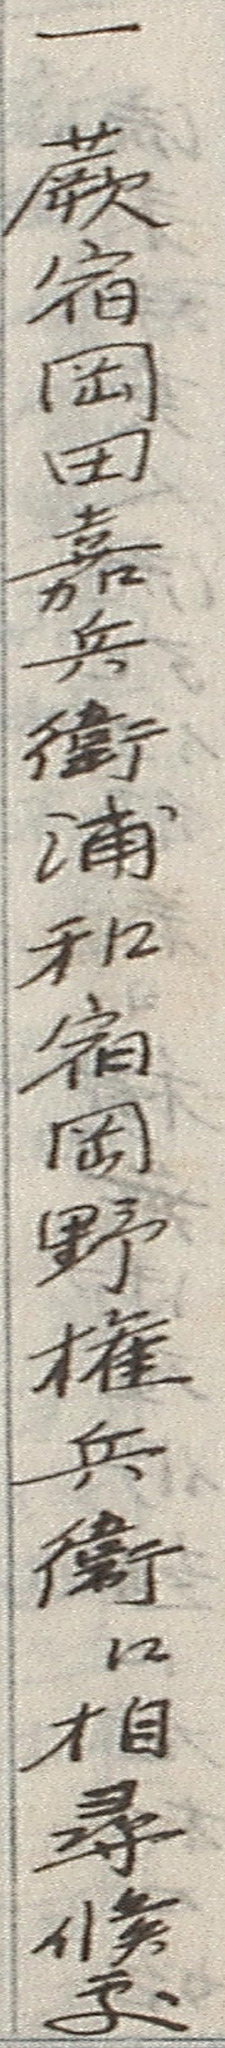一蕨宿岡田嘉兵衛浦和宿岡野権兵衛江相尋候処
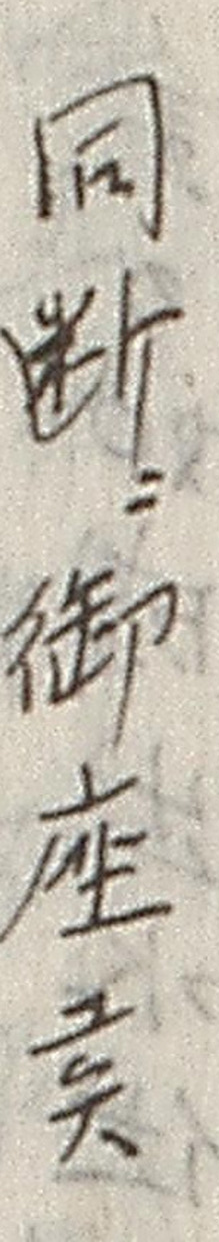同断二御座候
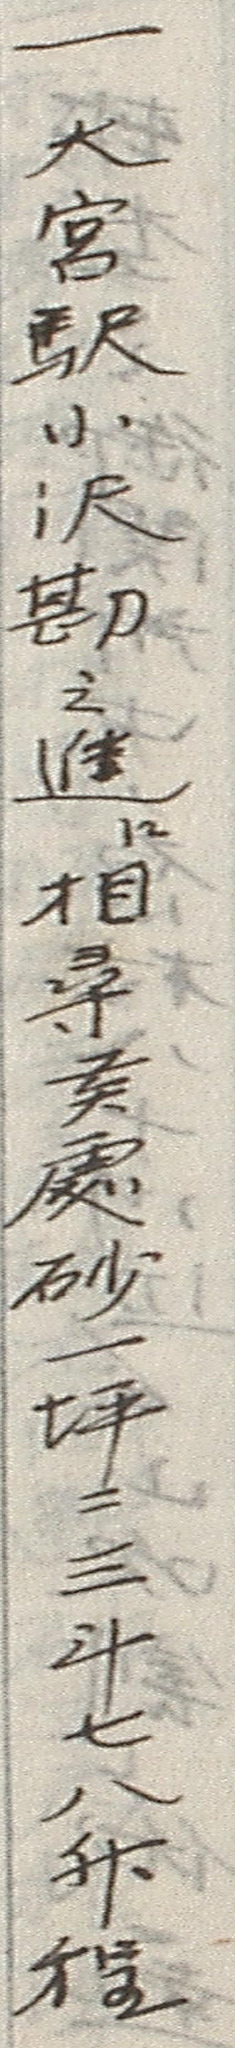一大宮駅小沢勘之進江相尋候処砂一坪二三斗七八升程
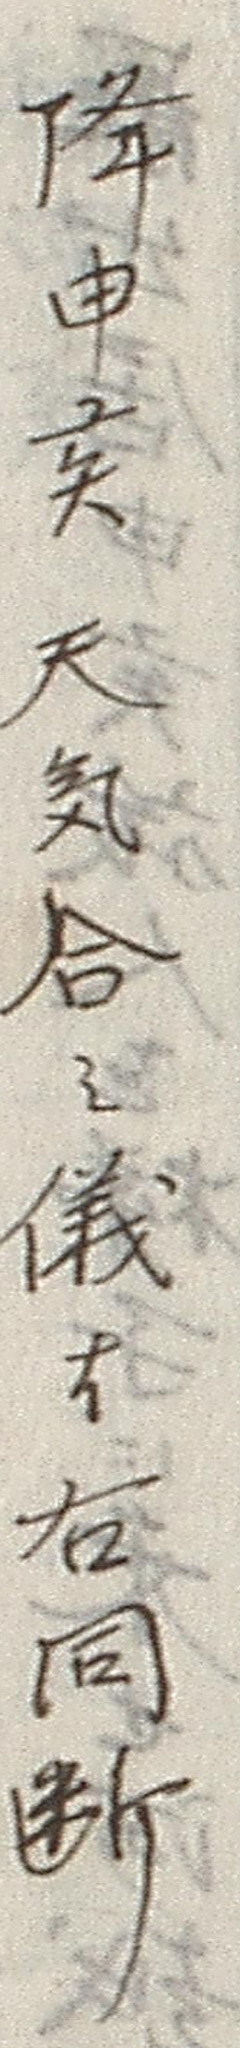降申候天気合之儀は右同断
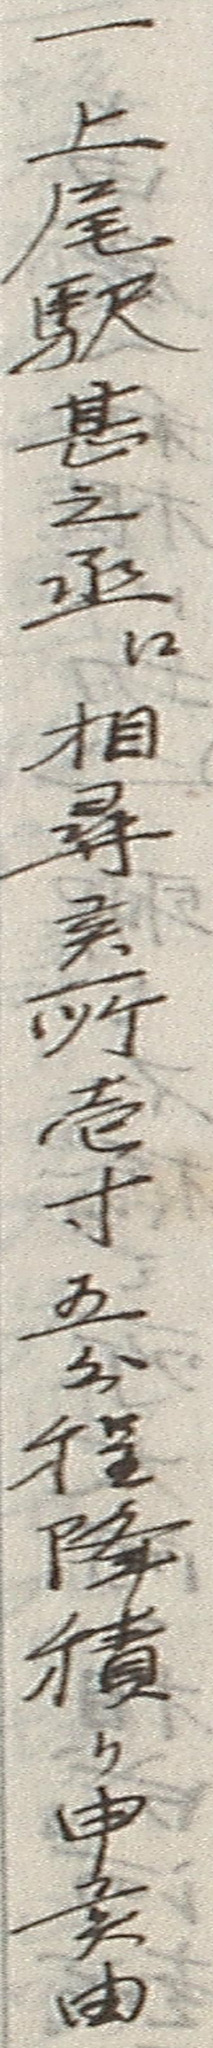一上尾駅甚之丞江相尋候所壱寸五分程降積り申候由
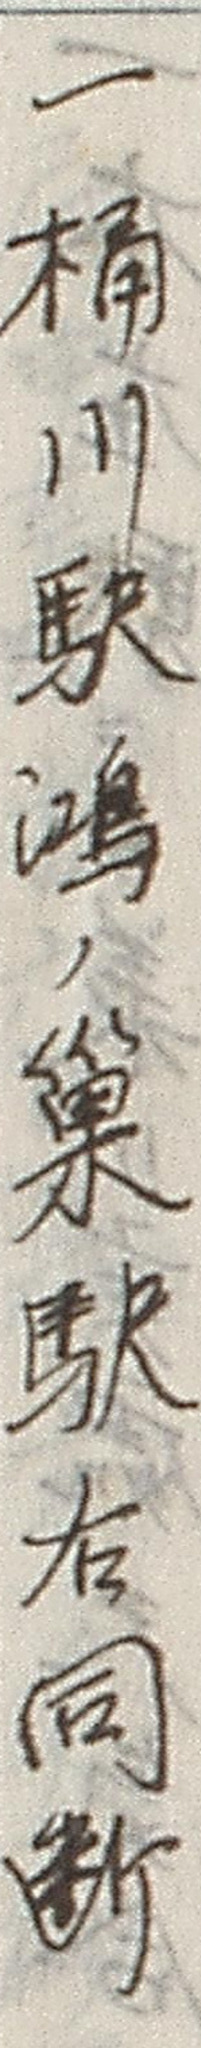一桶川駅鴻ノ巣駅右同断
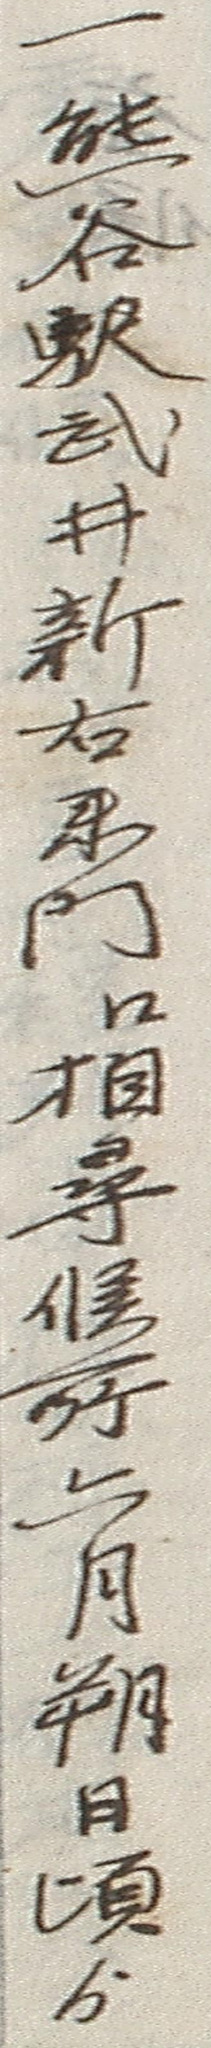一熊谷駅武井新右衛門江相尋候所六月朔日頃ゟ
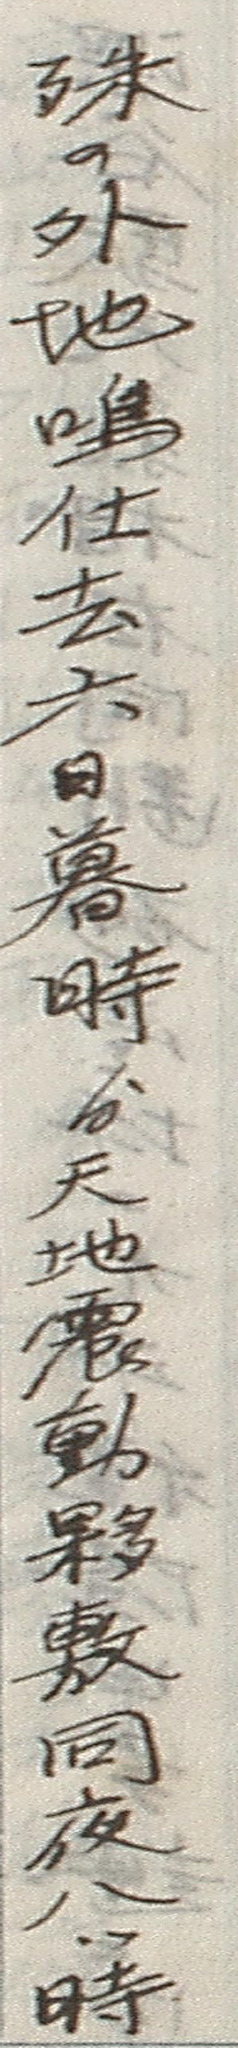殊の外地鳴仕去六日暮時ゟ天地震動夥敷同夜八ッ時
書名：浅間山焼出記
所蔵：東京大学地震研究所図書室 Earthquake Research Institute Library, The University of Tokyo, JAPAN
